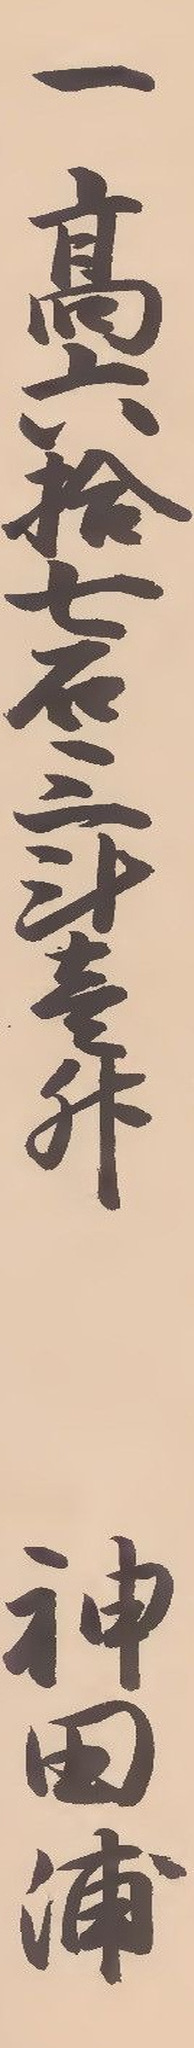一高六拾七石三斗壱升神田浦
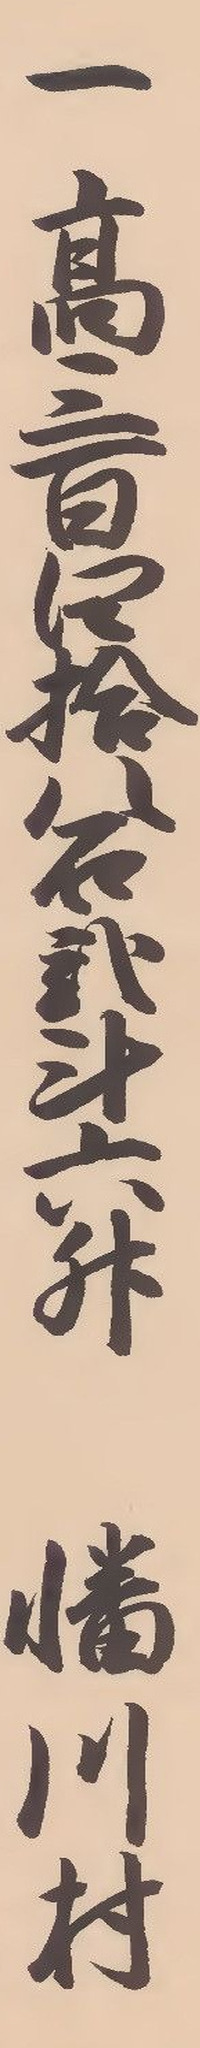一高三百四拾八石弐斗六升幡川村
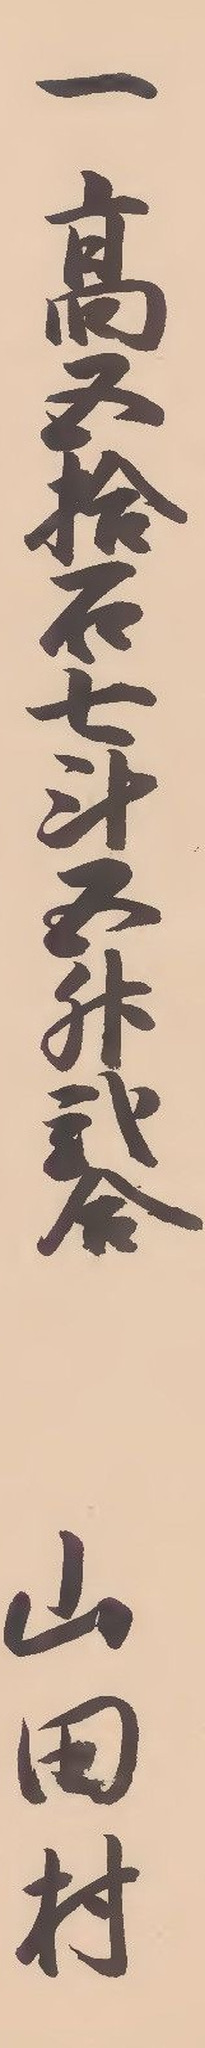一高五拾石七斗五升弐合山田村
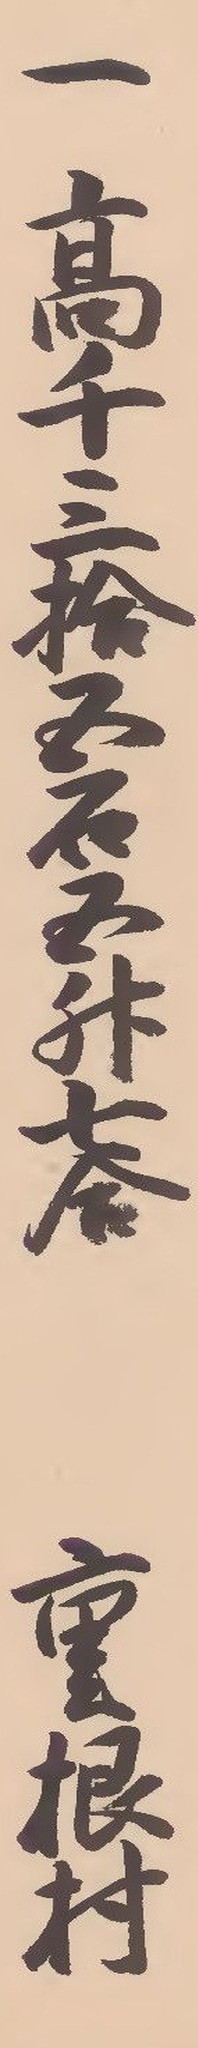一高千三拾五石五升七合重根村

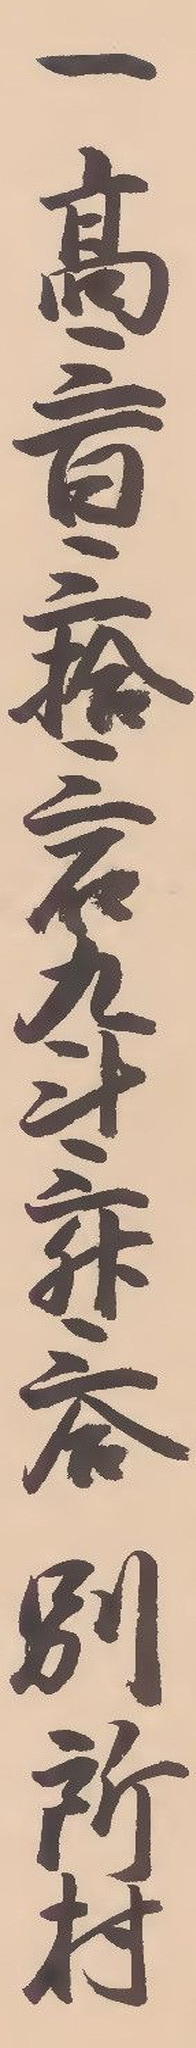一高三百三拾三石九斗三升三合別所村
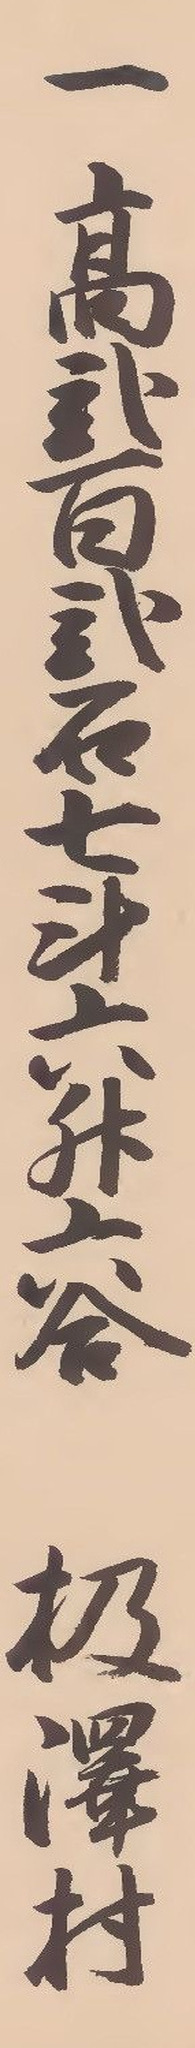一高弐百弐石七斗六升六合极沢村
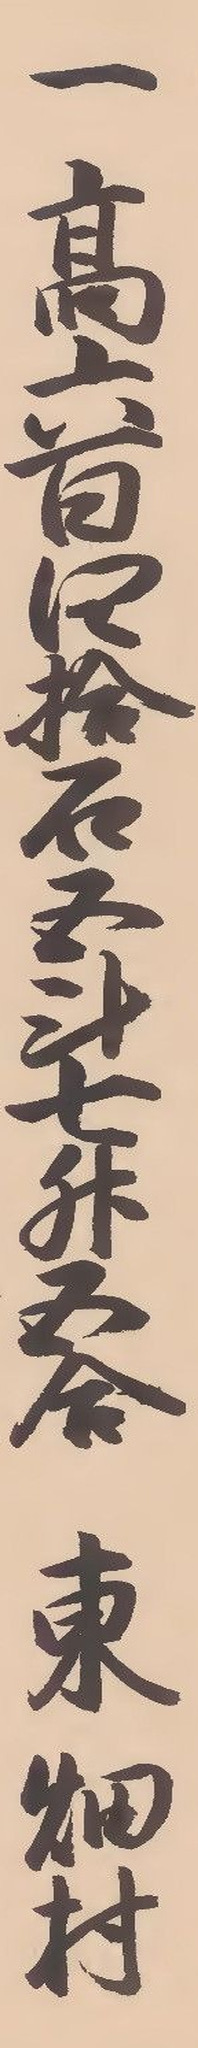一高六百四拾石五斗七升五合東畑村
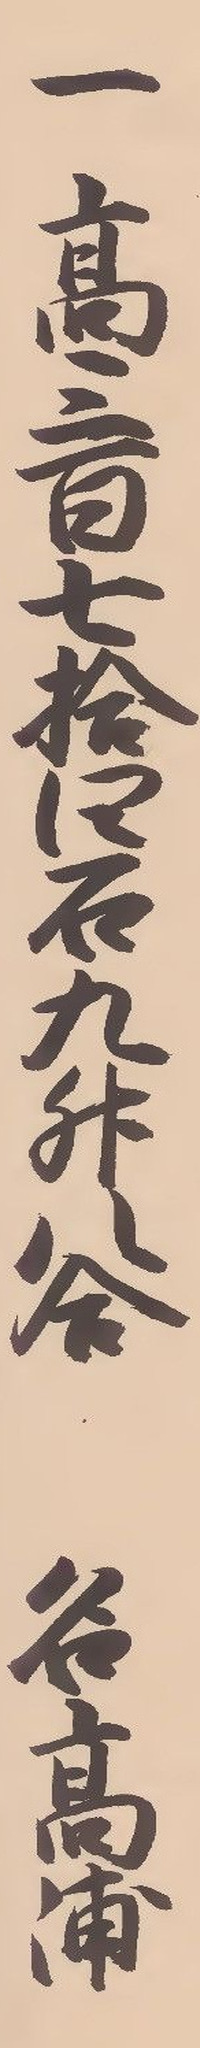一高三百七拾四石九升八合名高浦
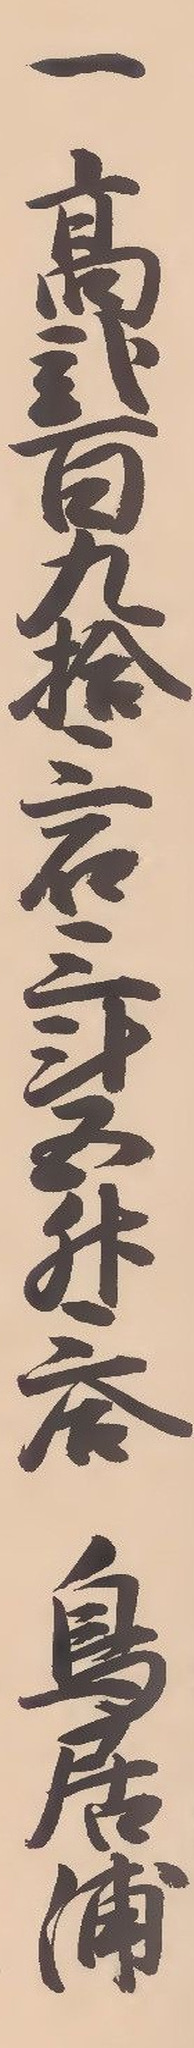一高弐百九拾三石三斗五升三合鳥居浦
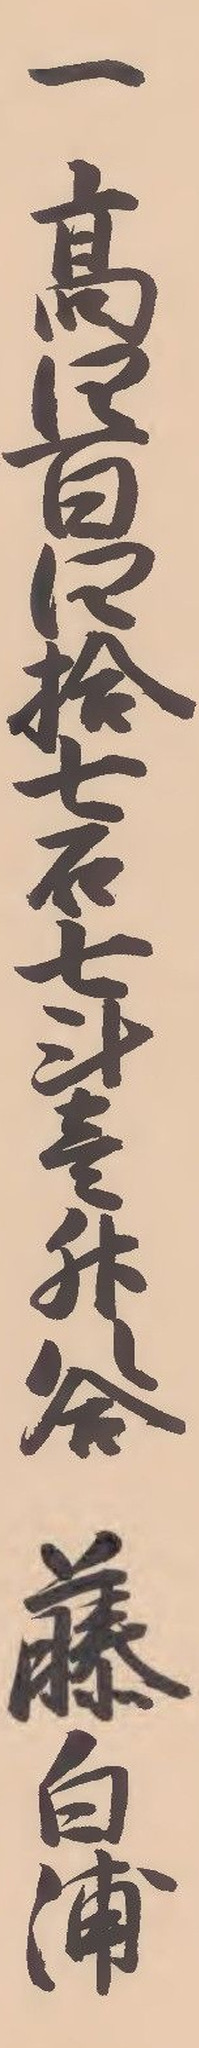一高四百四拾七石七斗壱升八合藤白浦
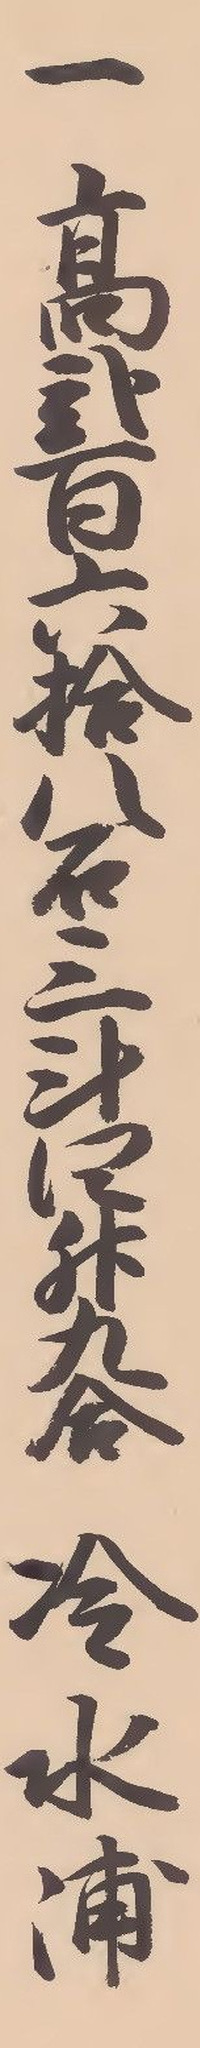一高弐百六拾八石三斗四升九合冷水浦
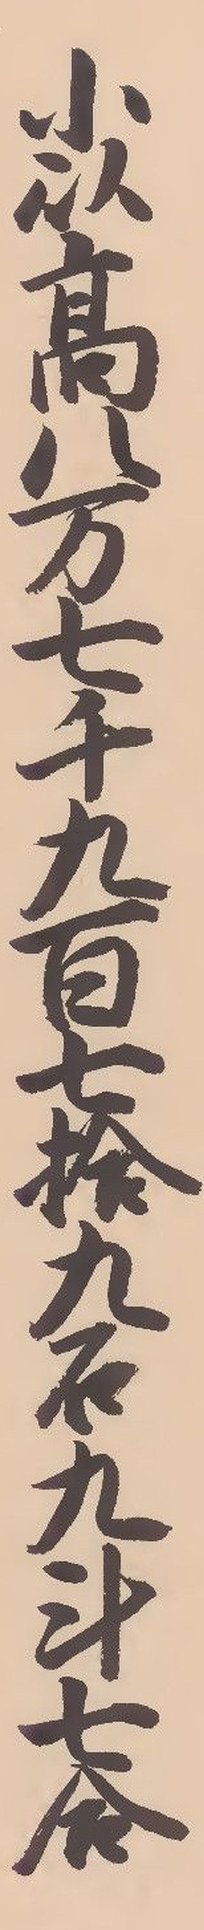小以高八万七千九百七拾九石九斗七合

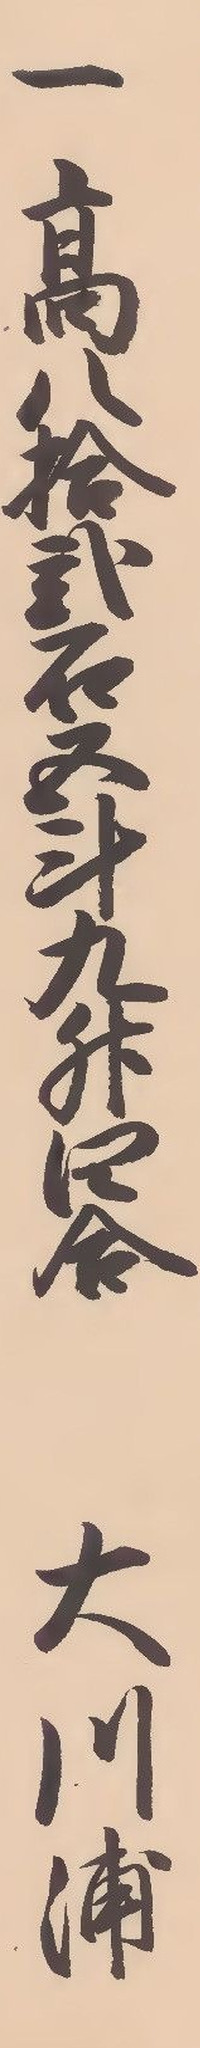一高八拾弐石五斗九升四合大川浦
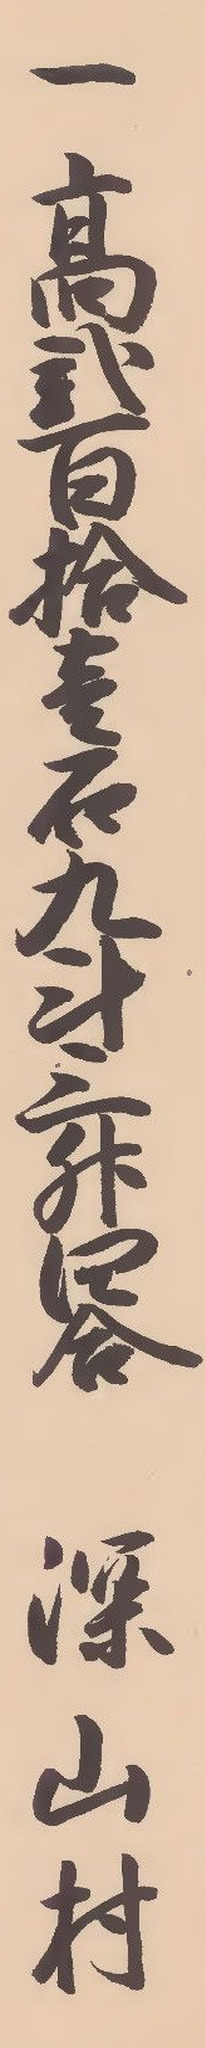一高弐百拾壱石九斗三升四合深山村
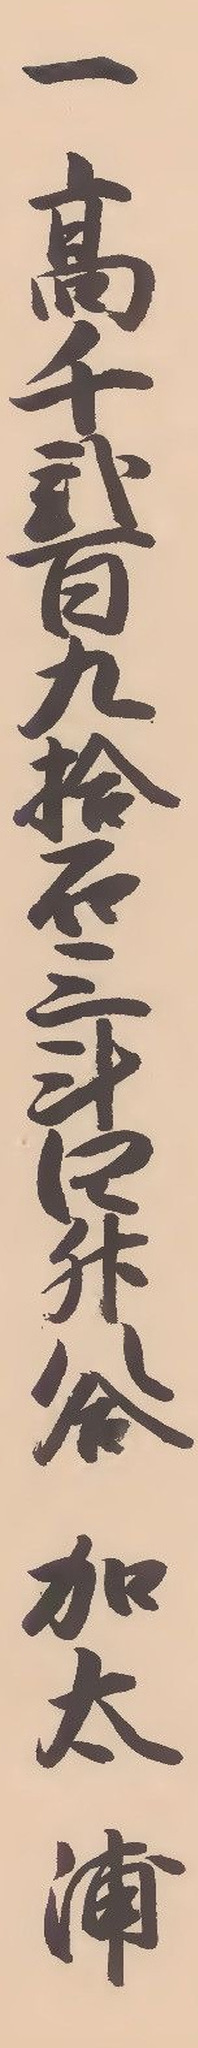一高千弐百九拾石三斗四升八合加太浦

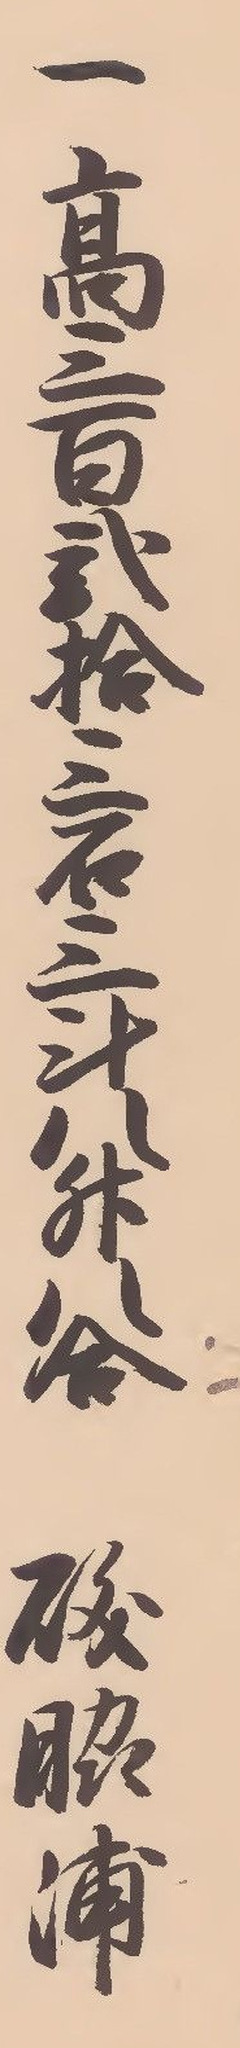一高三百弐拾三石三斗八升八合礒脇浦
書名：紀伊国郷帳
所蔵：国立公文書館 National Archives of Japan
